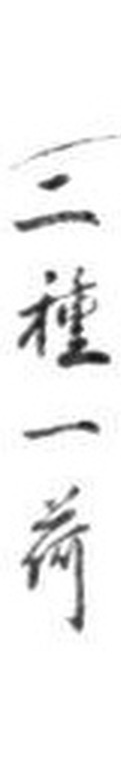二種一荷
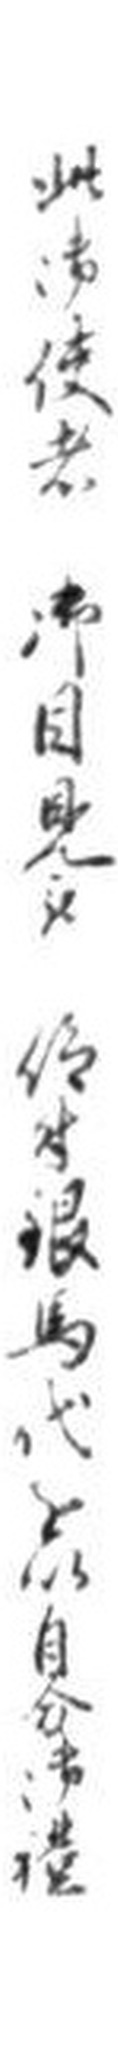此御使者御目見被仰付銀馬代を以自分御礼
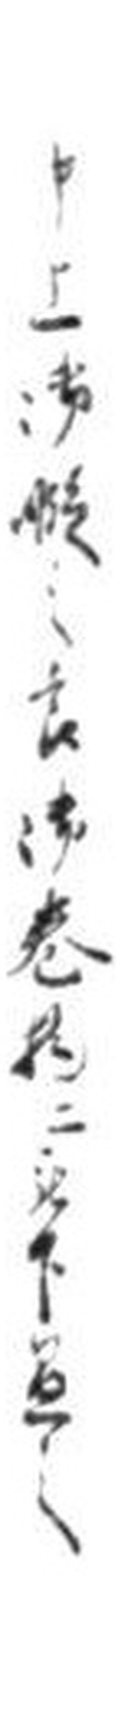申上御暇之節御巻物二被下置之
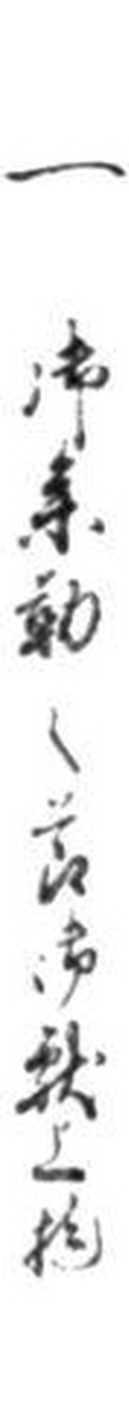一御参勤之節御献上物
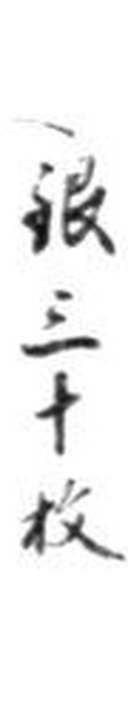銀三十枚
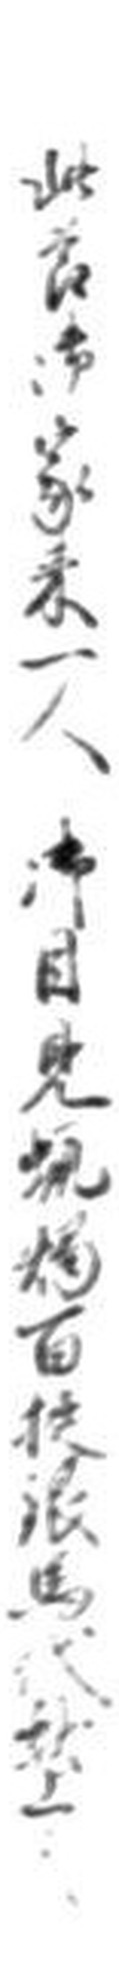此節御家来一人御目見蝋燭百挺銀馬代献上
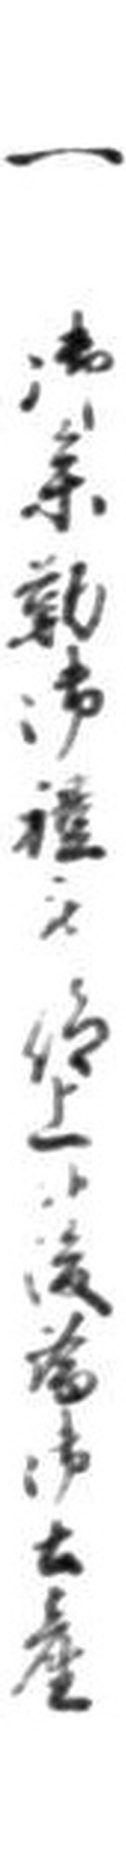一御参勤御礼被仰上候後為御土産
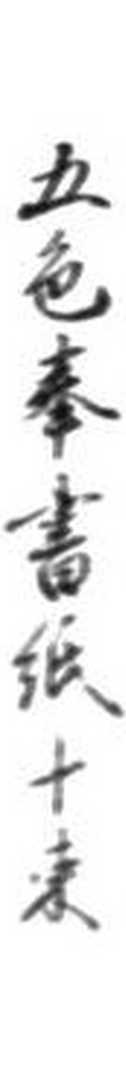五色奉書紙十束
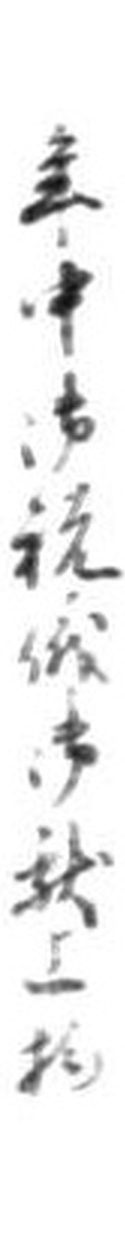一年中御祝儀御献上物
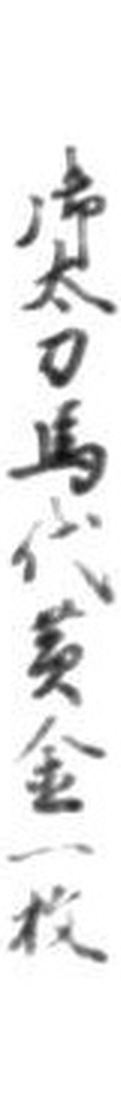年頭御太刀馬代黄金一枚
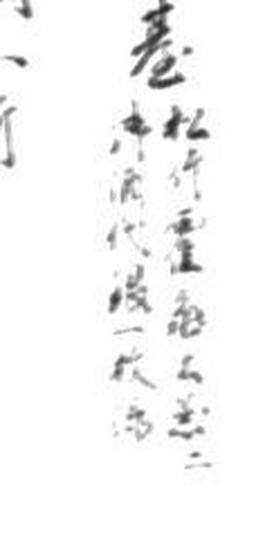御酒代銀一枚添
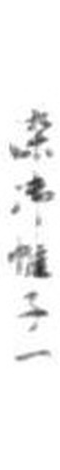染御帷子一

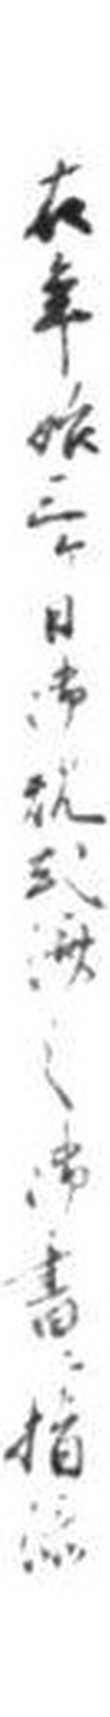右年始三ケ日御規式済之御書ニ指添
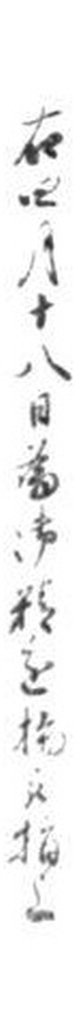右四月十八日為御精進揚被指上
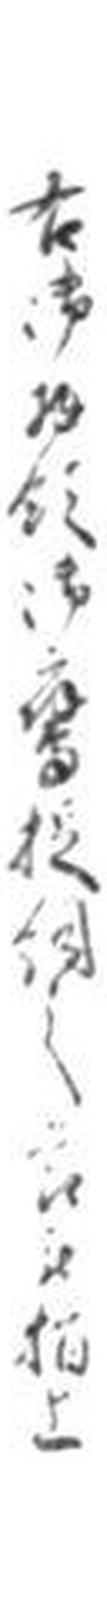右御拝領御鷹授飼之節被指上
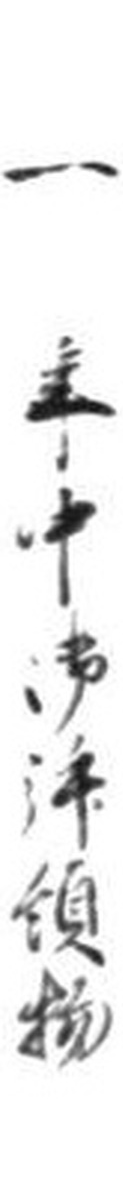一年中御拝領物
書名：家譜 三十六 宗昌公 従享保八年到同九年
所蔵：福井県文書館 Fukui Prefectural Archives
